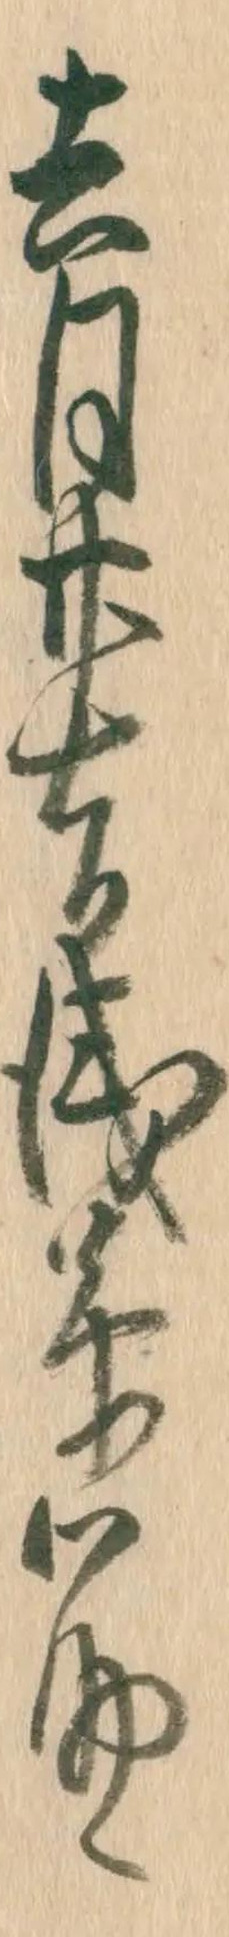去月廿七日浅草筋へ
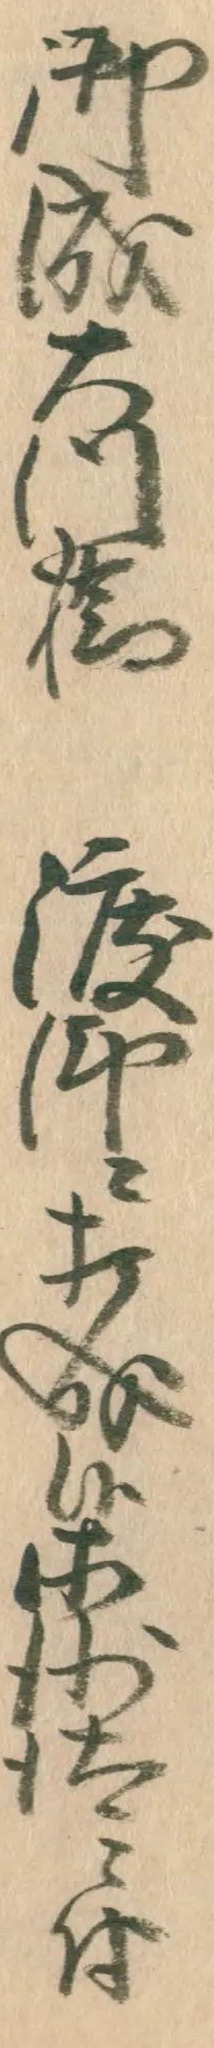御成大川橋渡御ニ相成候御沙汰ニ付

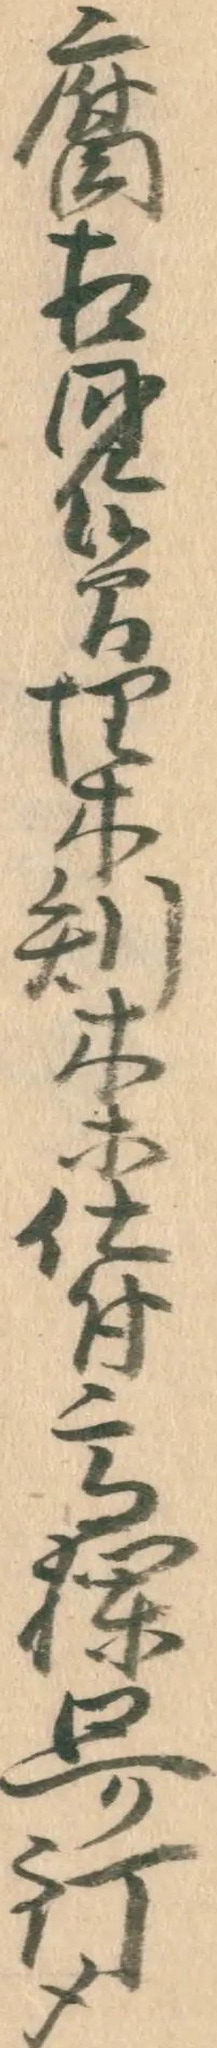腐相見候間埋木矧木等仕付高欄廻り釘〆
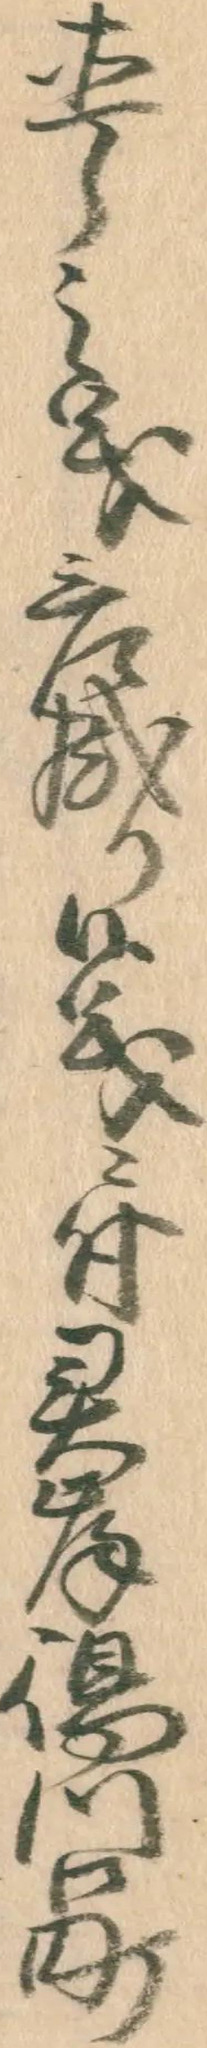直し之義差掛り候義に付霊岸島川口町
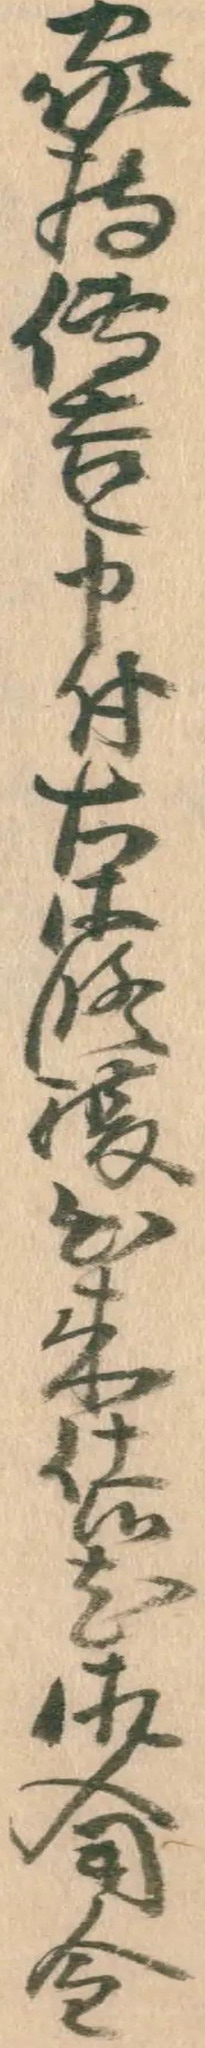家持伝吉へ申付右御修復出来仕候尤御入用金
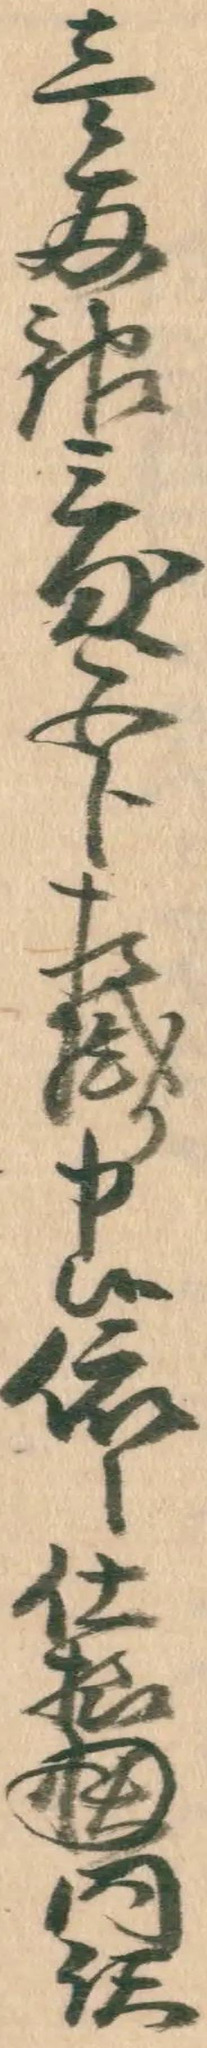壱両銀三匁五分相掛り申候依之仕様「帳」内訳
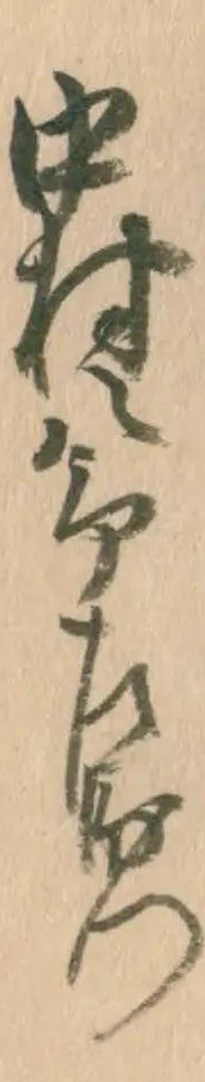中村八郎左衛門

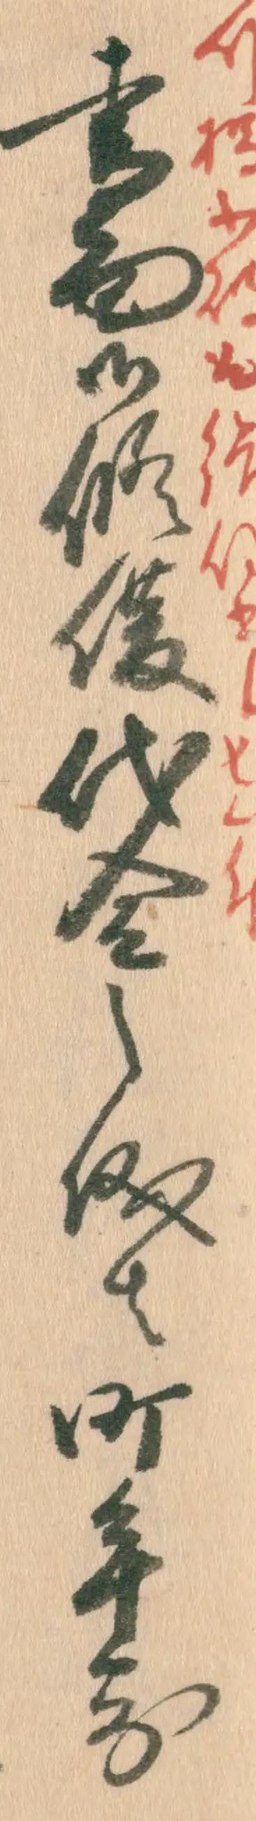書面御修復代金之儀は町年寄
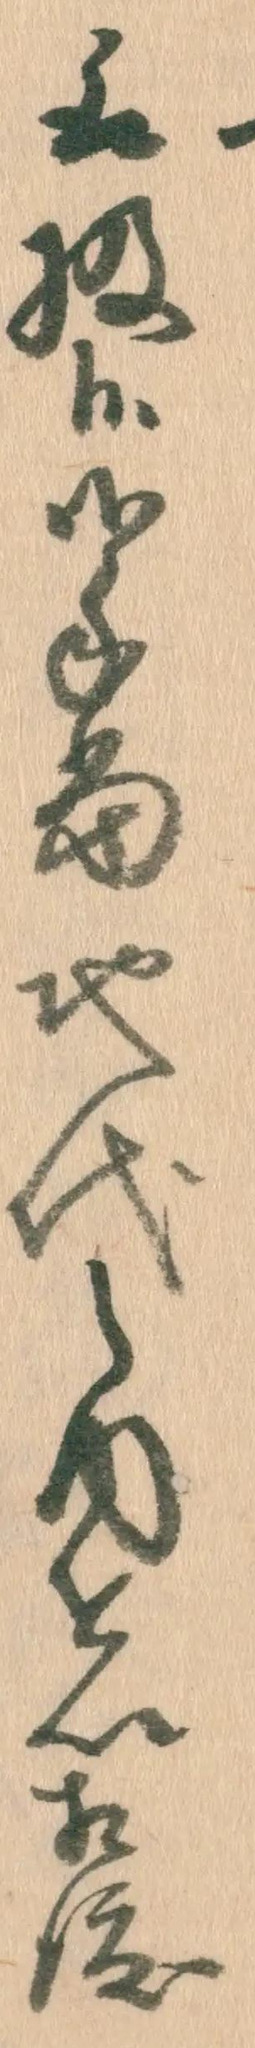取扱候御手当地代之内を以相渡
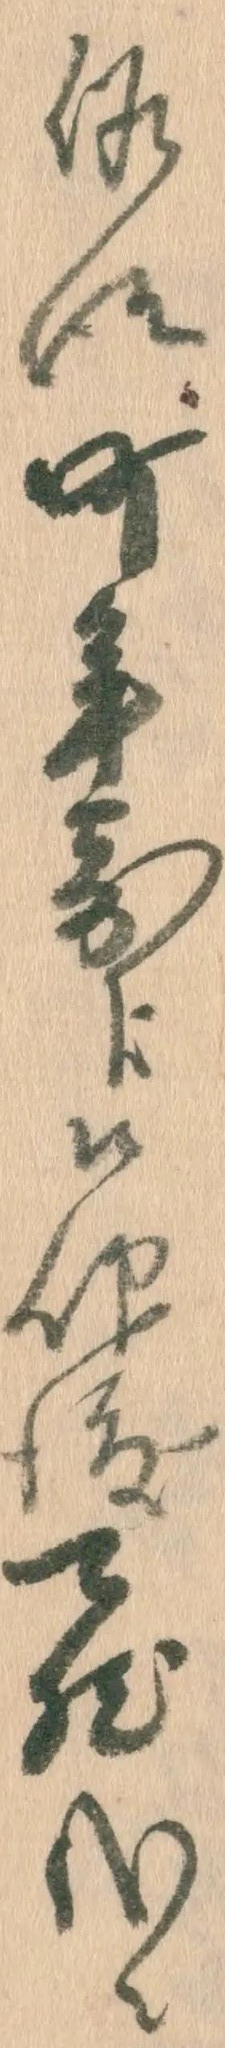候様町年寄え被仰渡可然哉ニ
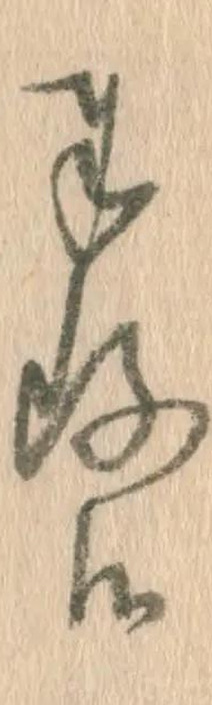奉存候
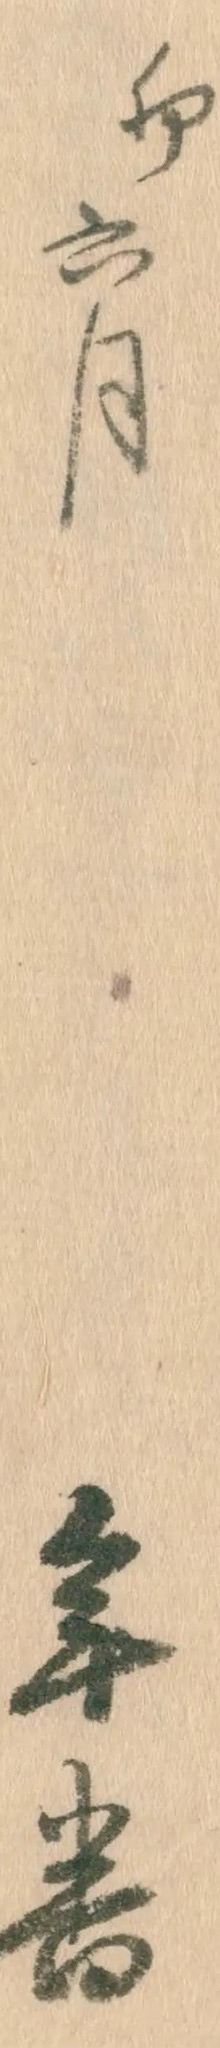卯六月年番

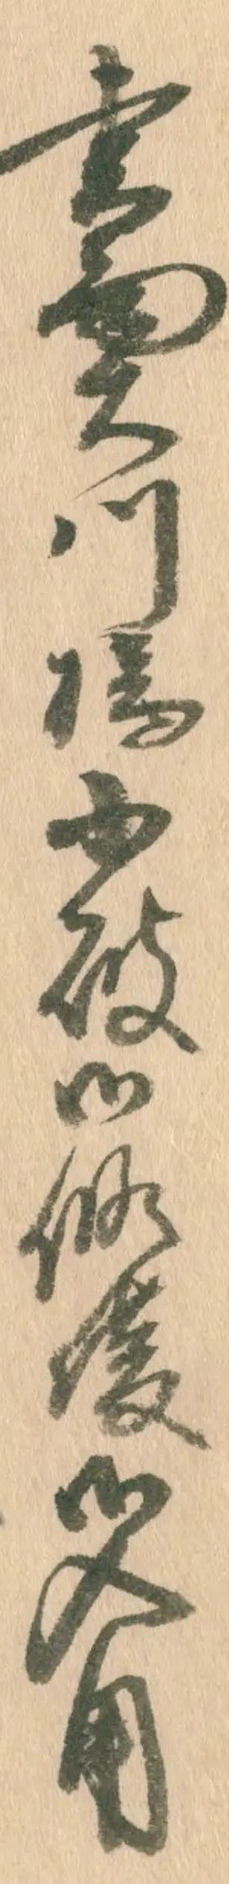書面大川橋小破御修復御入用
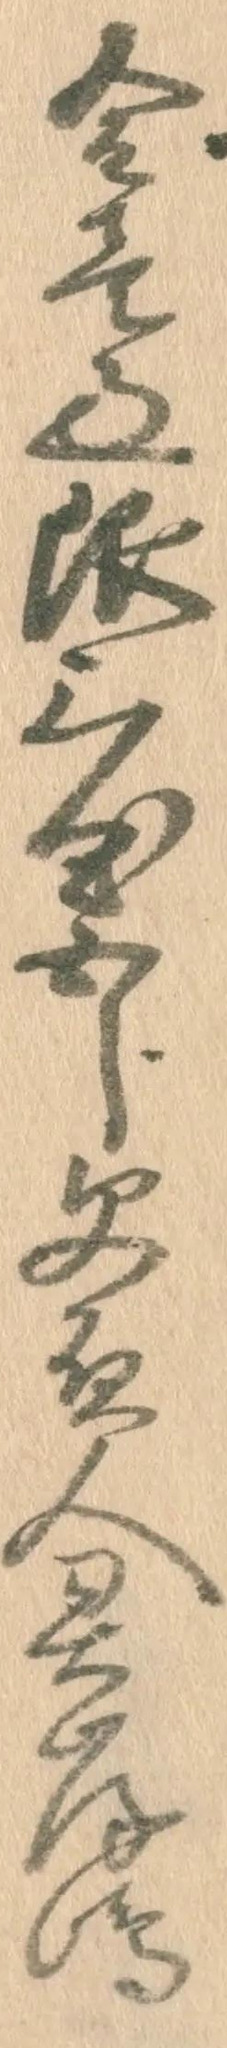金壱両銀三匁五分受負人霊岸島
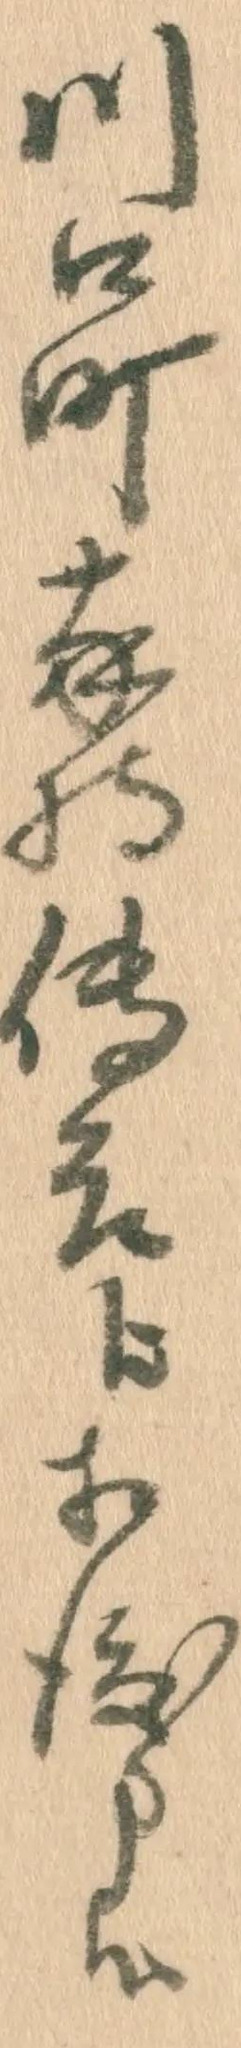川口町家持伝吉え相渡申候
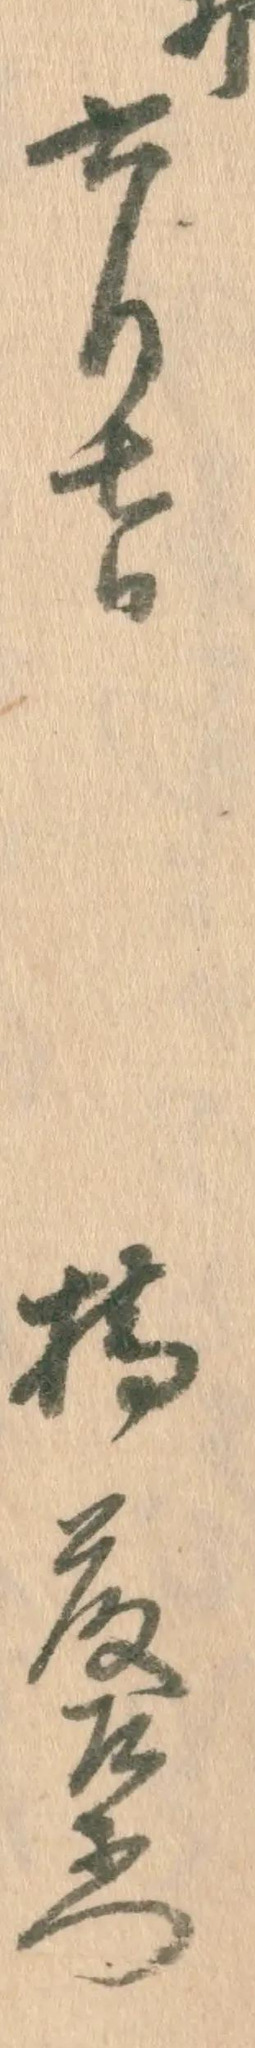卯六月七日樽藤左衛門
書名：三橋 17巻. [8] 三橋小破御修復書留　但御奉行御掛リ替地震潰橋番屋　嘉永四亥年より安政二卯年迄　下
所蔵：国立国会図書館 National Diet Library, JAPAN
